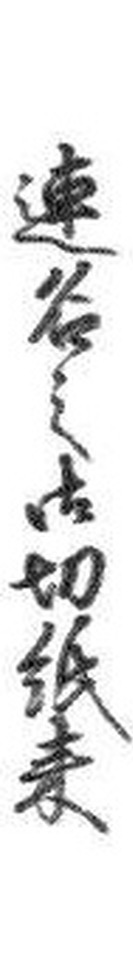連名之御切紙来
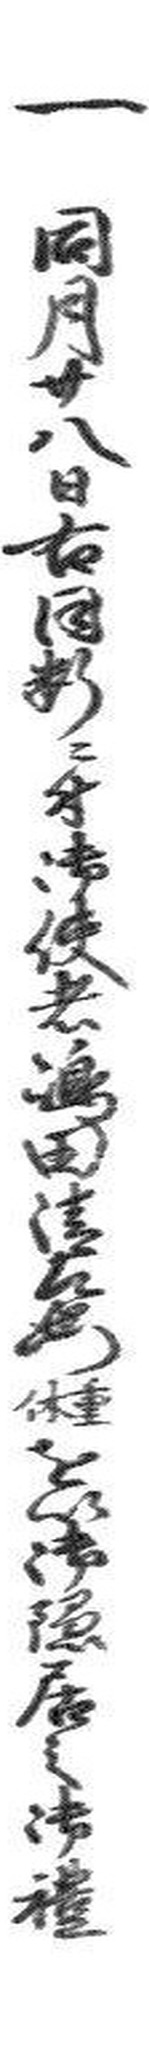一同月廿八日右同断ニ付御使者嶋田清左衛門重休を以御隠居之御礼
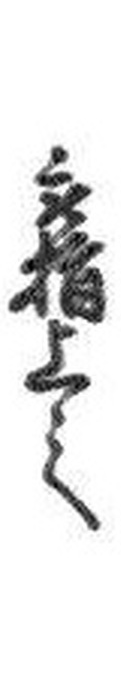被指上之
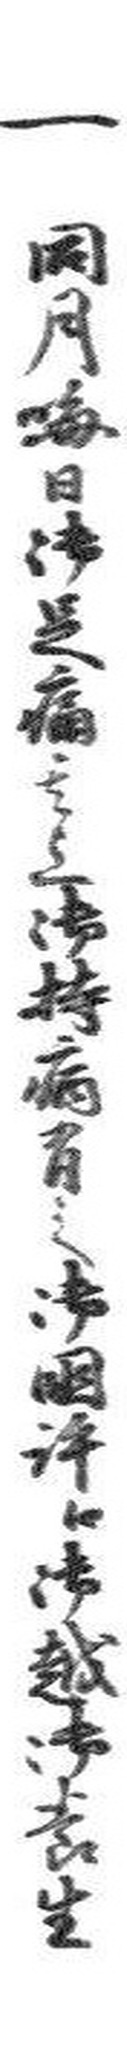一同月晦日御足痛其上御持病有之御国許江御越御養生
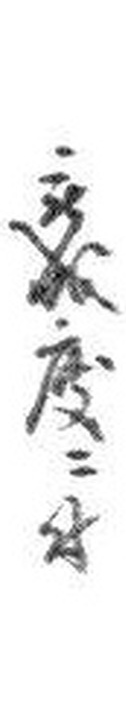被成度ニ付
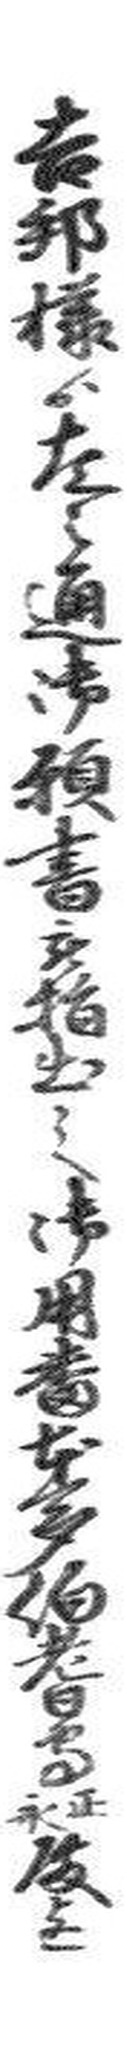吉邦様ゟ左之通御願書被指出之御用番本多伯耆守正永殿迄

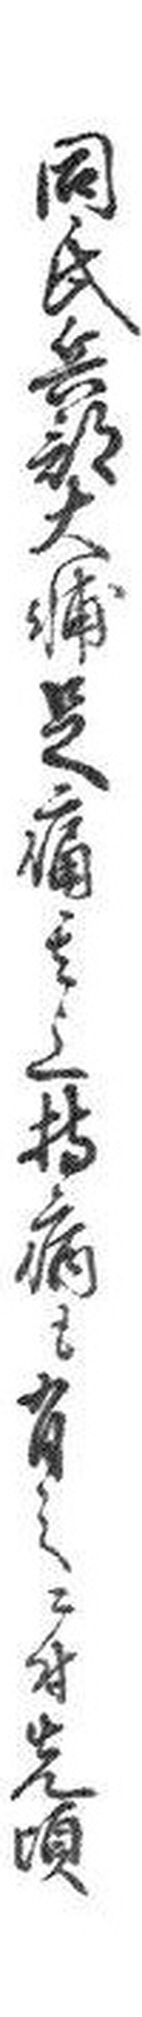同氏兵部大輔足痛其上持病も有之ニ付先頃
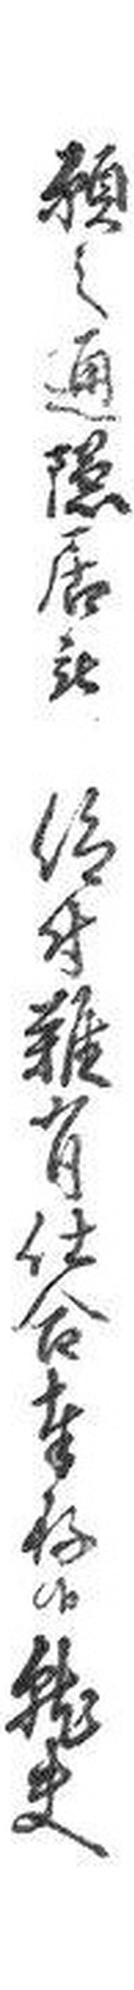願之通隠居被仰付難有仕合奉存候就夫
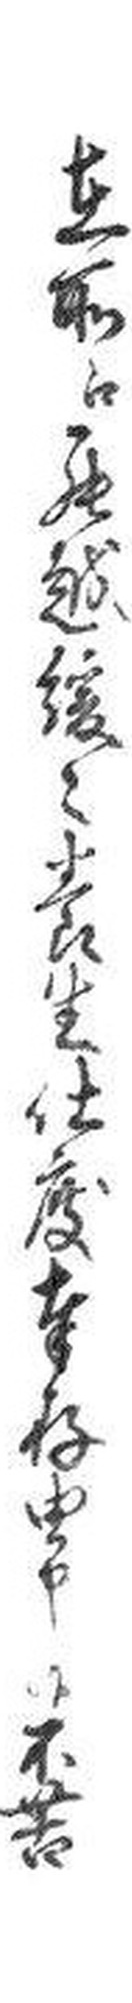在所江罷越緩々養生仕度奉存由申候不苦
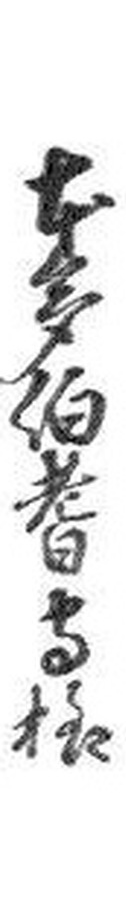本多伯耆守様
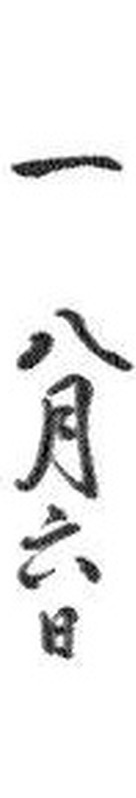一八月六日
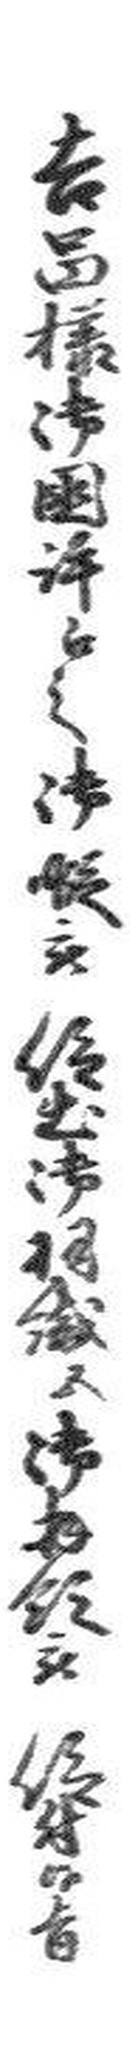吉品様御国許江之御暇被仰出御羽織五御拝領被仰付候旨
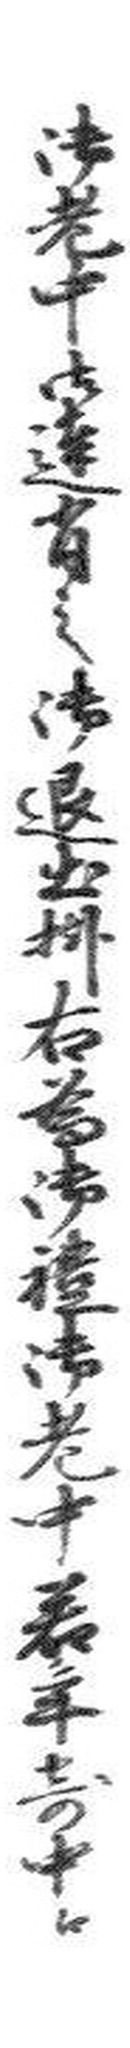御老中御達有之御退出掛右為御礼御老中若年寄中江
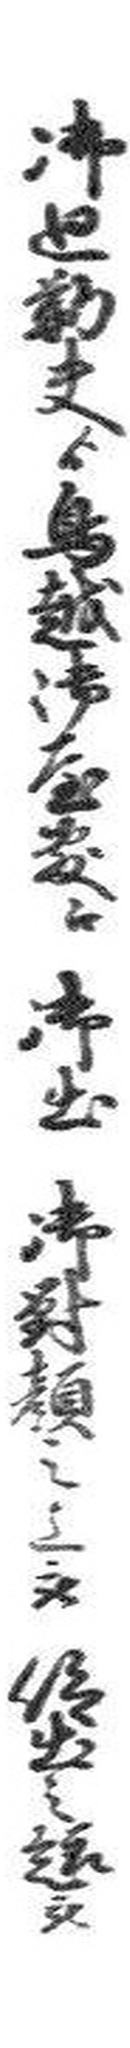御廻勤夫ゟ鳥越御屋敷江御出御対顔之上仰出之趣被
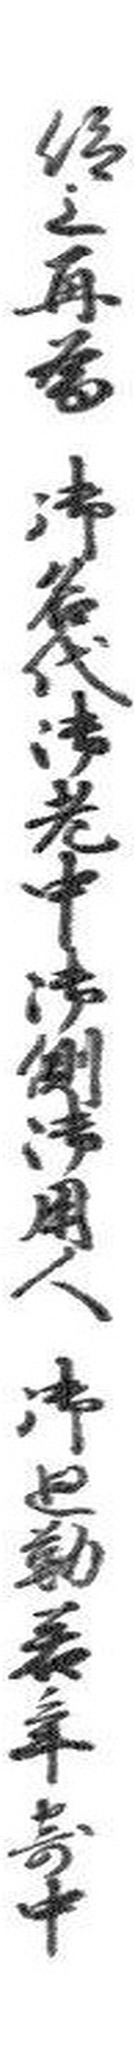仰上再為御名代御老中御側御用人御廻勤若年寄中
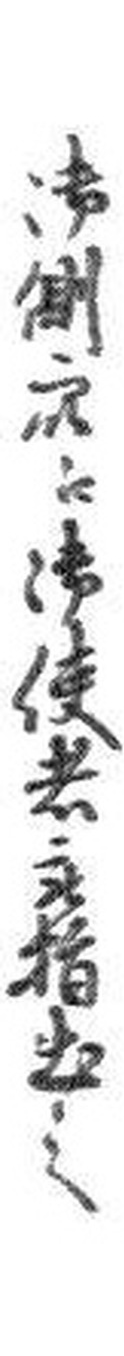御側衆江御使者被指出之
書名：家譜 二十六 吉品公 従宝永七年到正徳二年
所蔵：福井県文書館 Fukui Prefectural Archives
